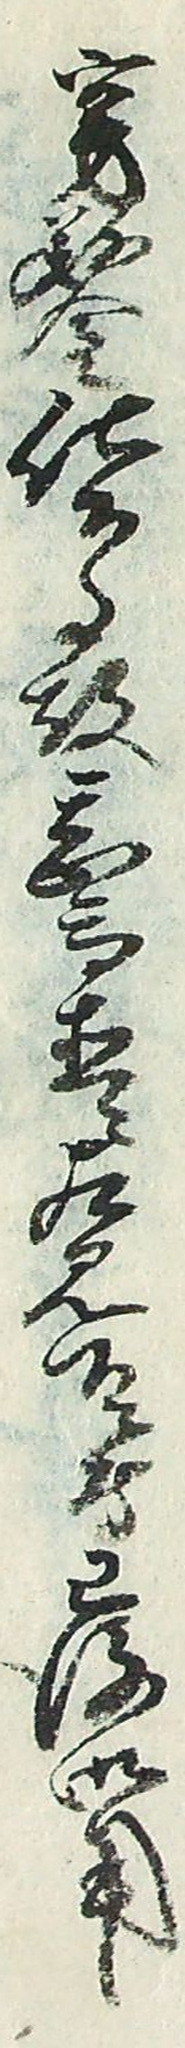穿鑿仕候事故甚高直に相見候に付已後御用

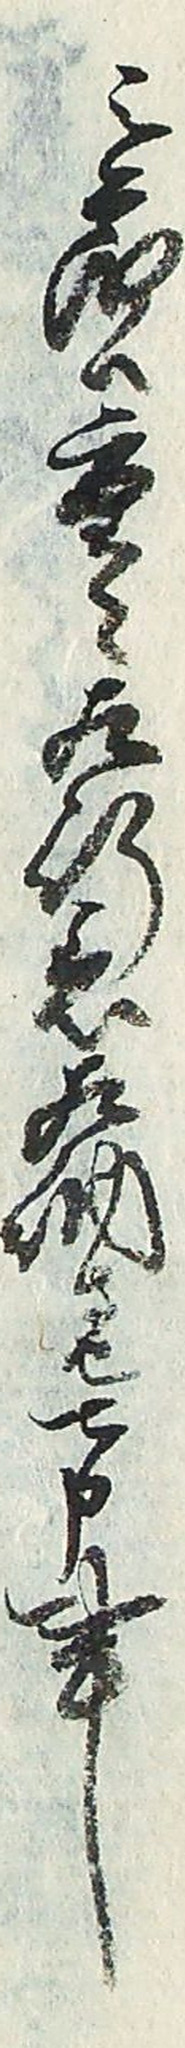の節は重々相行着相納させ可申事
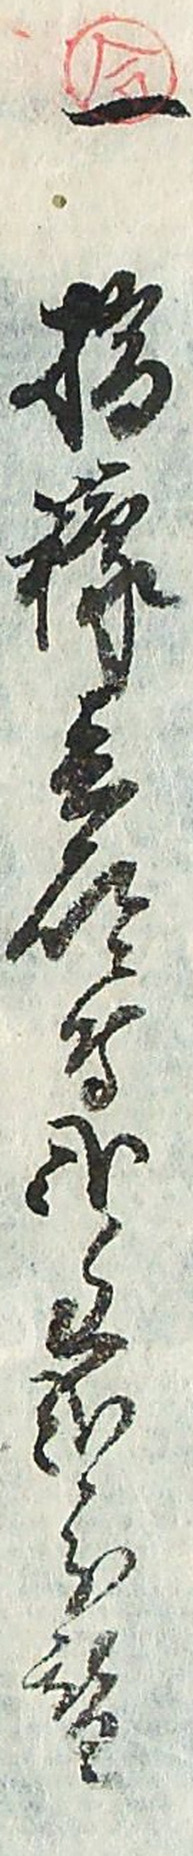一摺橡一石に付二匁二分替
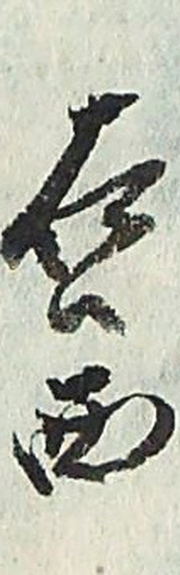右は西
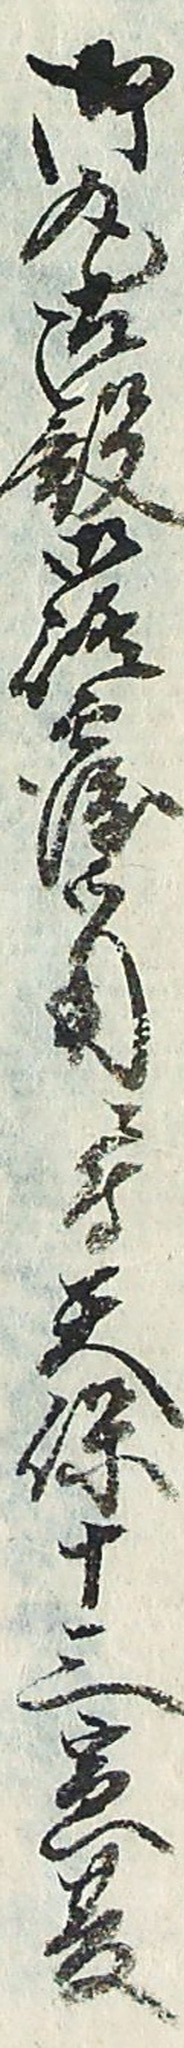御丸御殿御修覆御用に付天保十三寅年夏
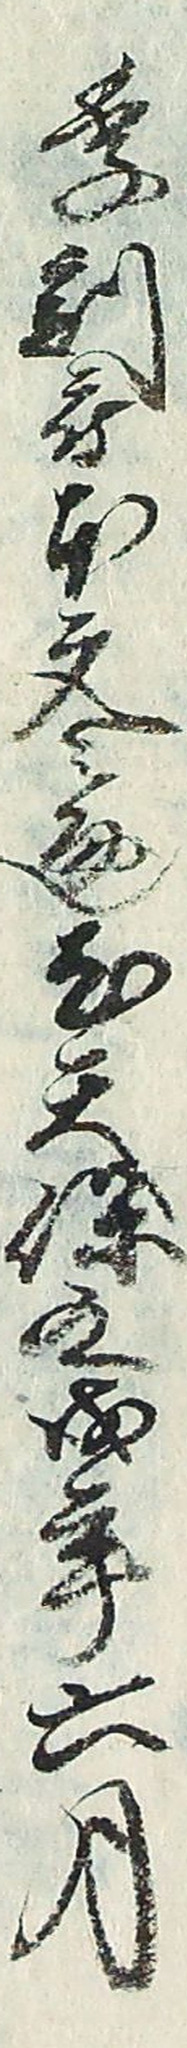季割符本文の通尤天保九戌年六月
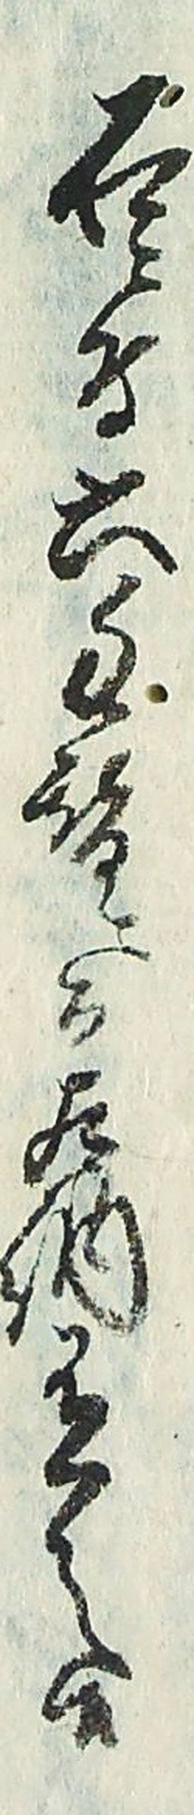石に付六匁替にて相納有之候
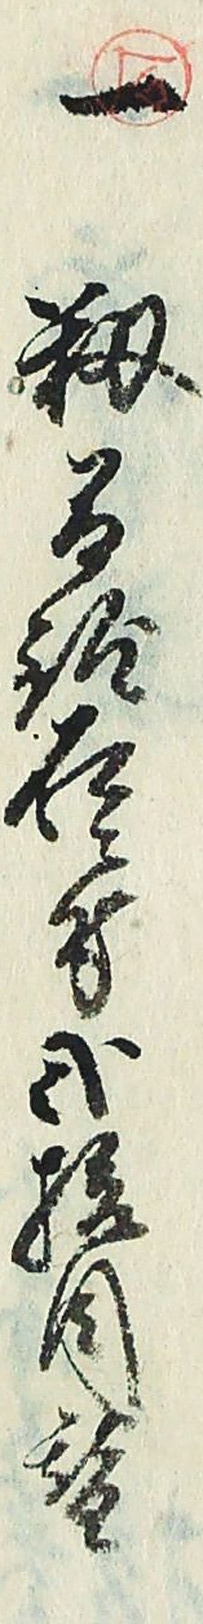一籾間銀石に付二十目替
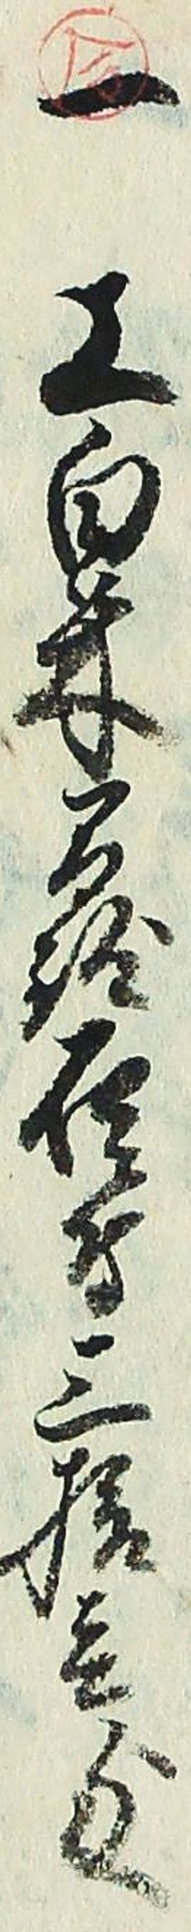一上白米間銀石に付三十一匁
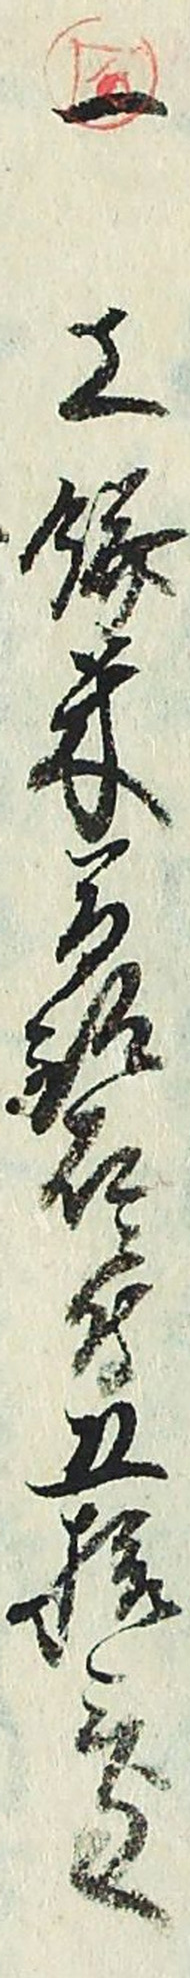一上餅米間銀石に付五十三匁
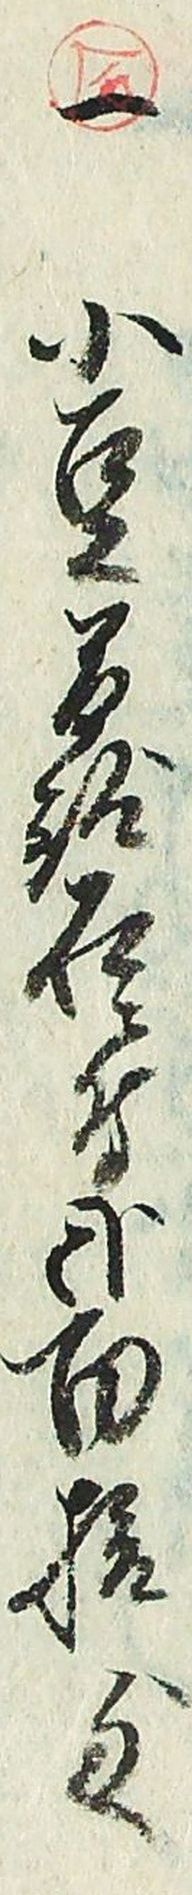一小豆間銀石に付二百十匁
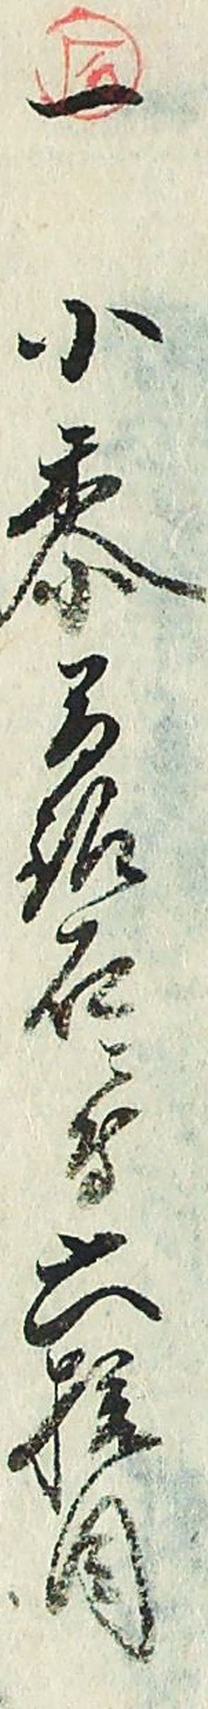一小黍間銀石に付六十目
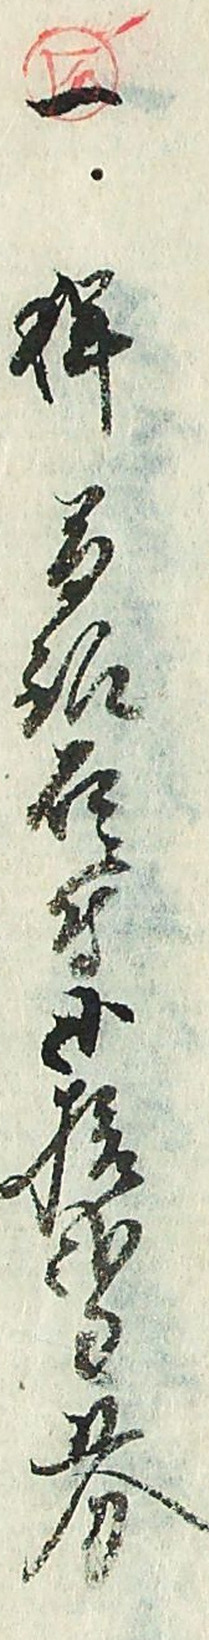一稗間銀石に付二十匁五分
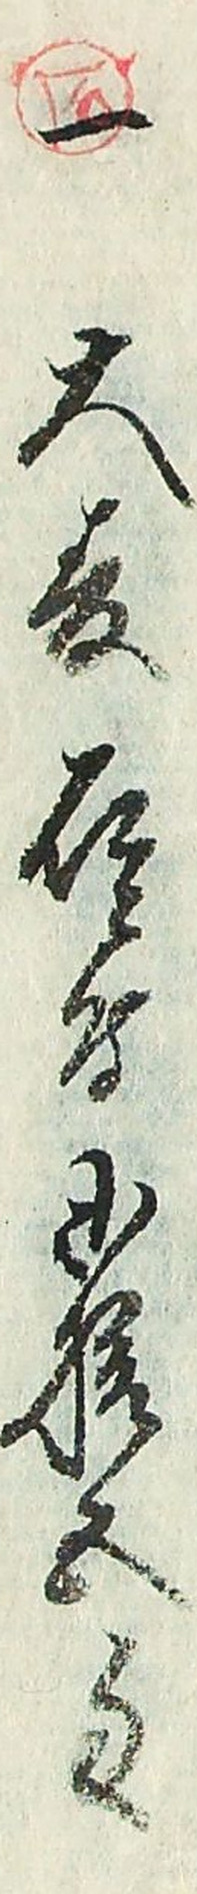一大麦石に付二十五匁

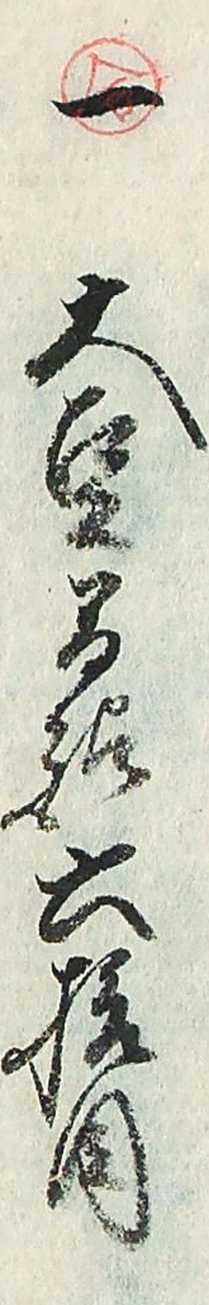一大豆間銀六十目
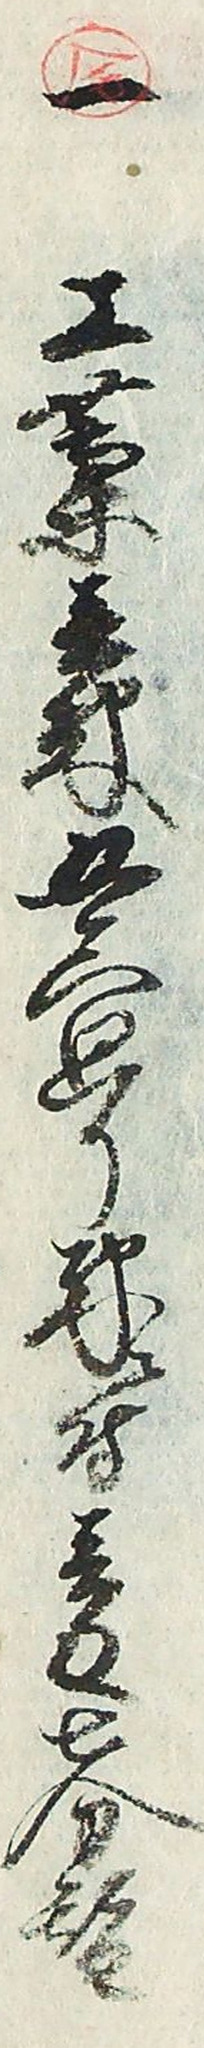一上藁一束五尺廻り束に付一匁七分替
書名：諸割賦物賃銀定記録帳
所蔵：鳴門教育大学 Naruto University of Education
